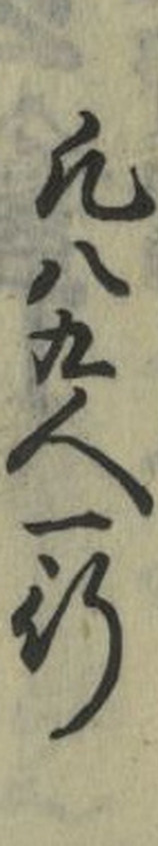凡八九人一行
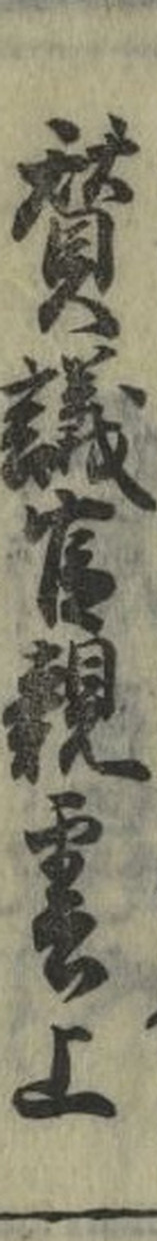賛議官親雲上
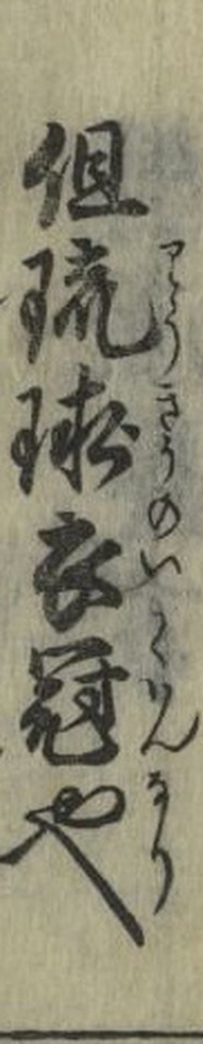但琉球衣冠也
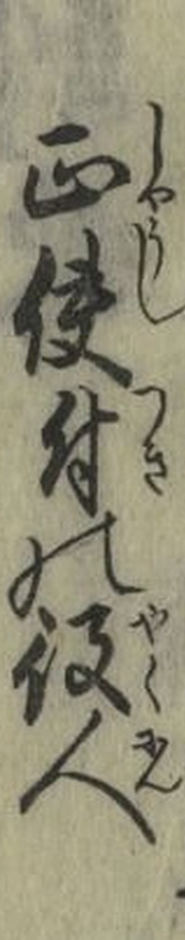正使付の役人

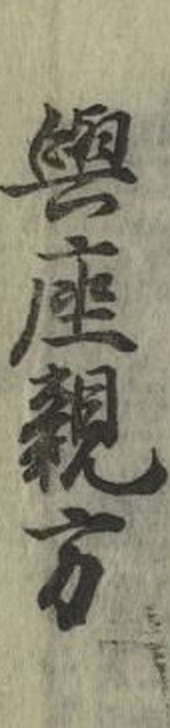與座親方
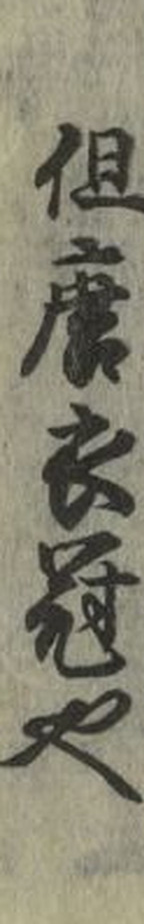但唐衣冠也
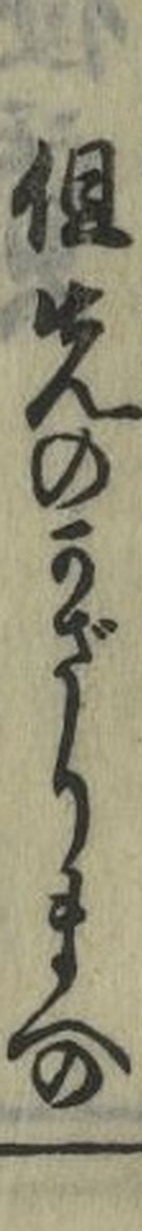但先のかざりまへの
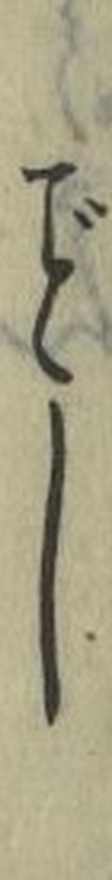ごとし
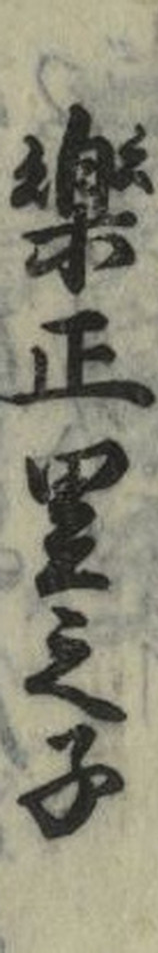楽正里之子
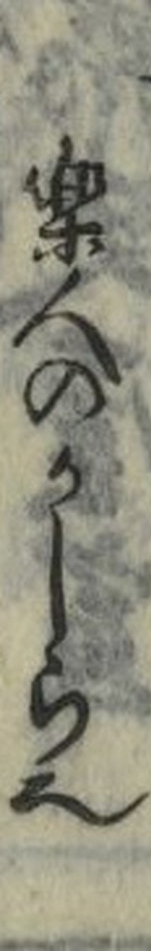楽人のかしら也
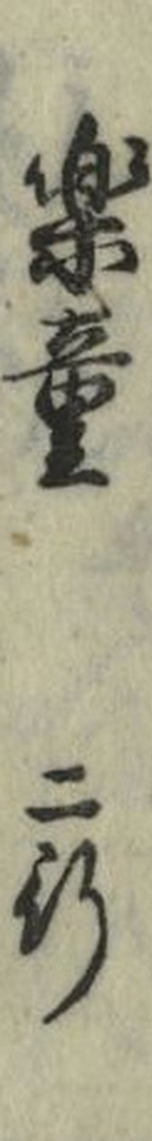楽童二行
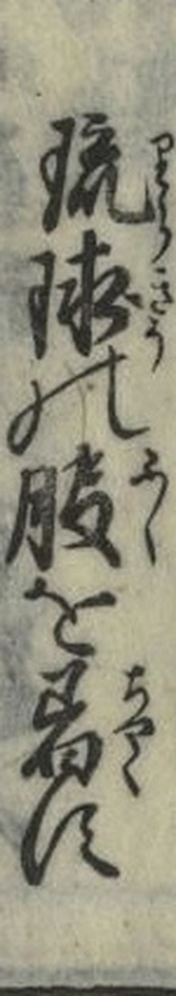琉球の服を着す
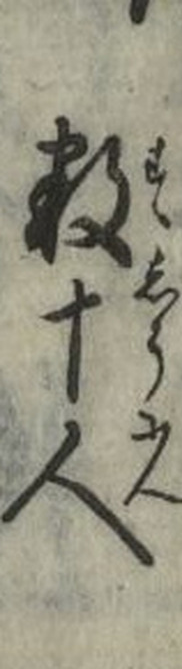数十人

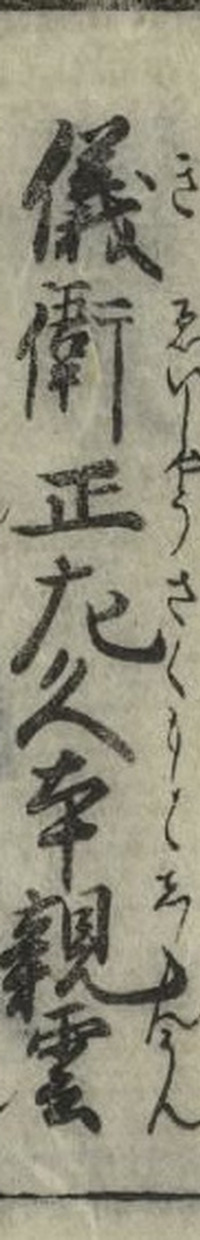議衛正左久本親雲上
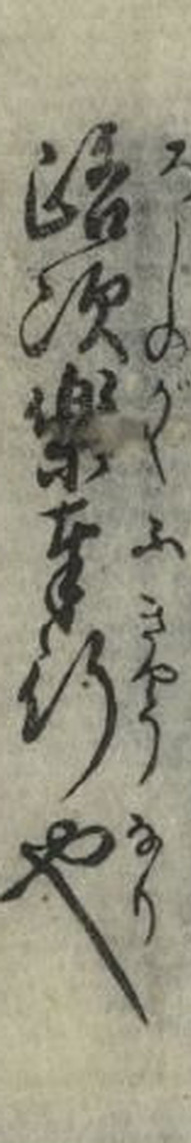路次楽奉行也
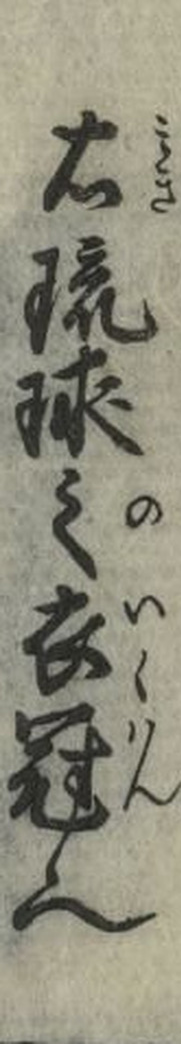右琉球之衣冠也
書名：琉球人大行列記
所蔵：University of the Ryukyus Library
